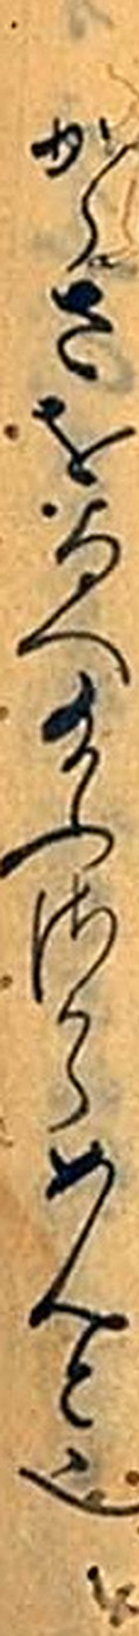からさを与へ給ふさからめんと也

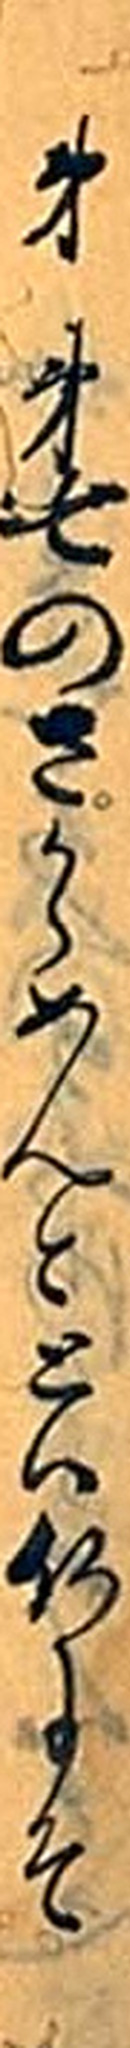弟第七のさからめんととは何事そ
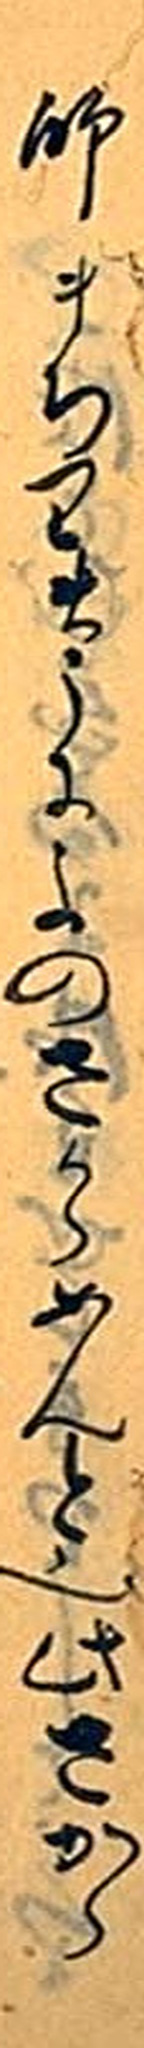師まちりまうによのさからめんと也此さから
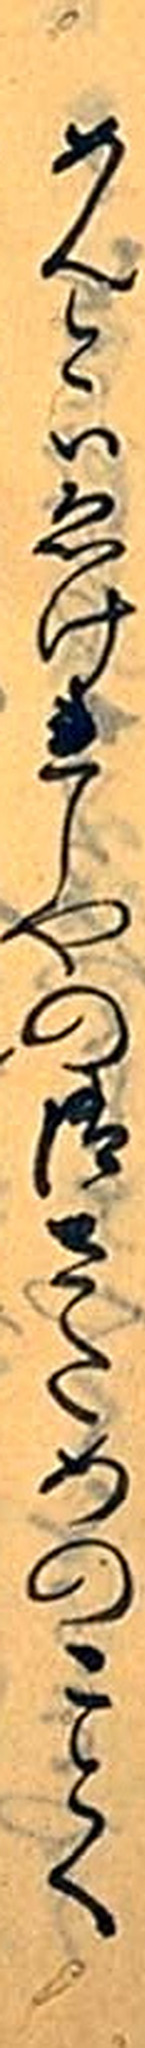めんとはゑけれしやの御さためのことく
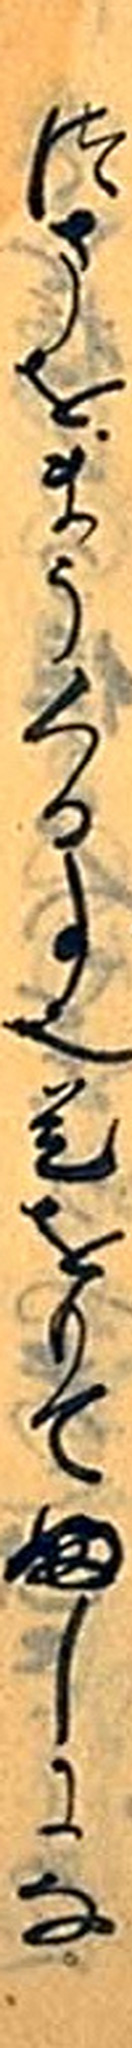つまをまうくる事也是をもてふしにな
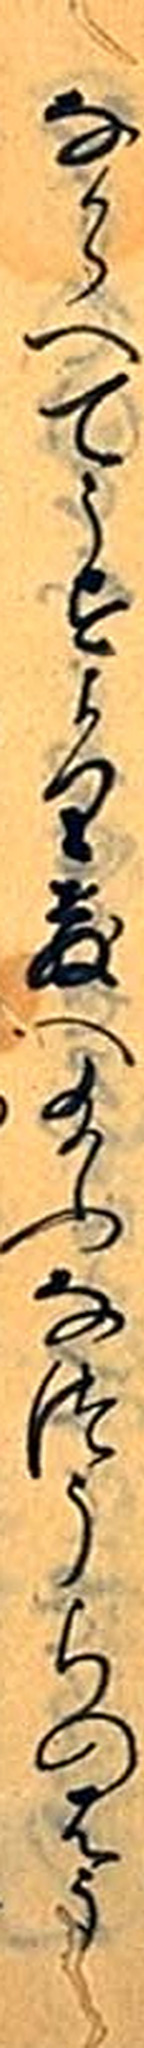なからへてうすより教へ給ふなつうらのはう
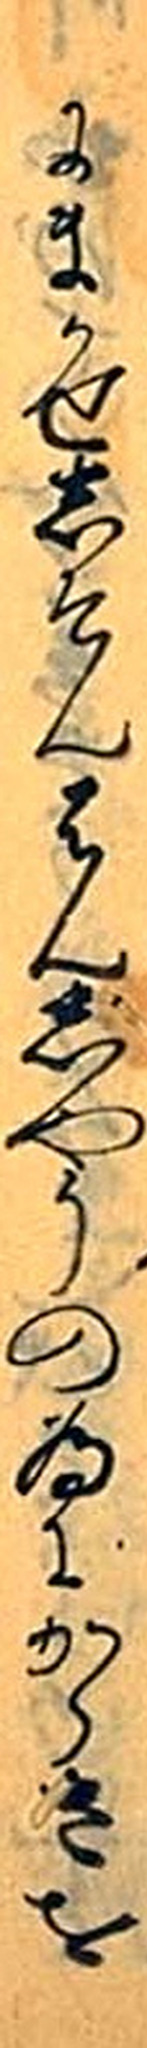にまかせしそんはんしやうの為にからさを
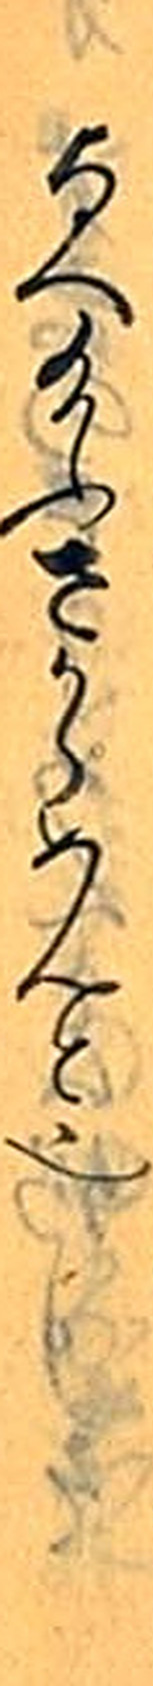与へ給ふさからめんと也
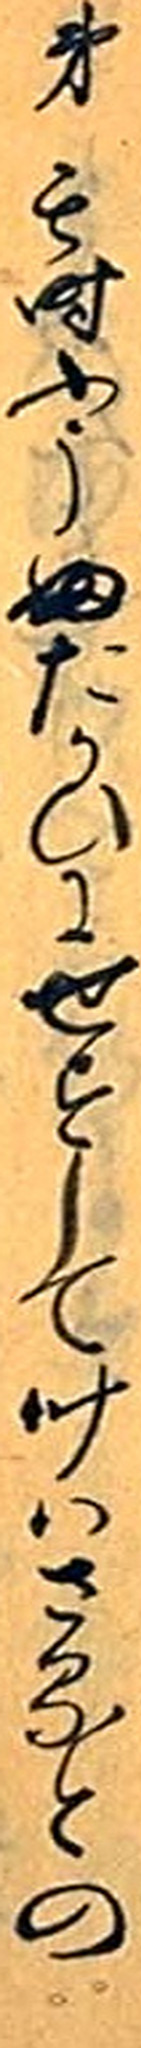弟其時ふう婦たかひにせすして叶はさるとの
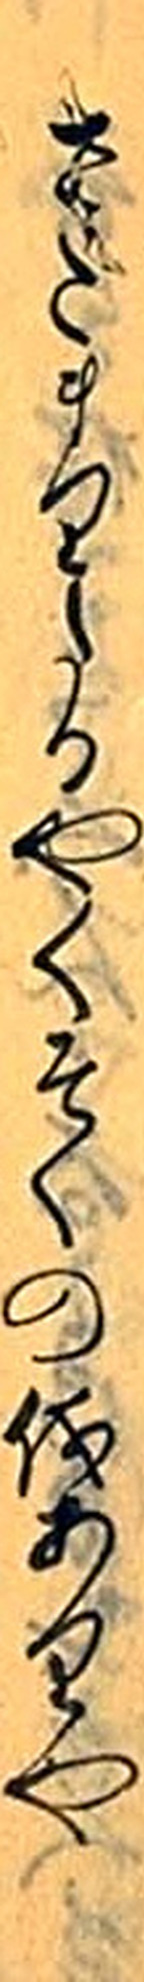さたまりたるやくそくの儀ありや
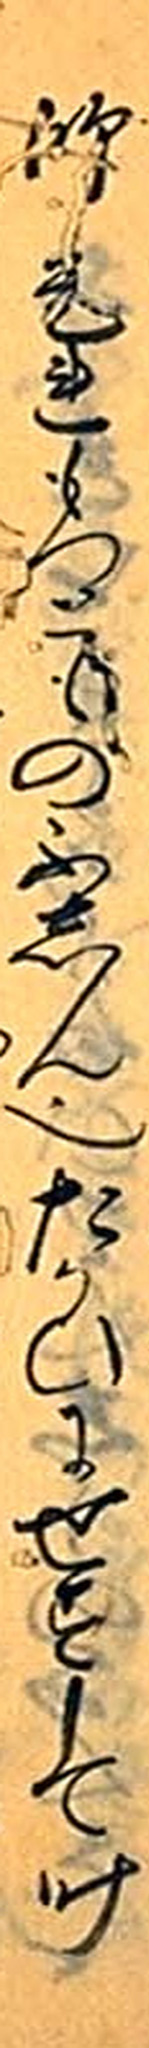師是れもつとものふしん也たかひにせすして叶
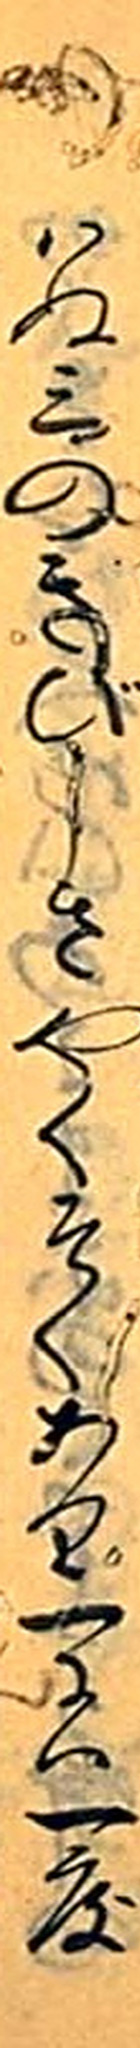はぬ三のきびしきやくそくあり一には一度
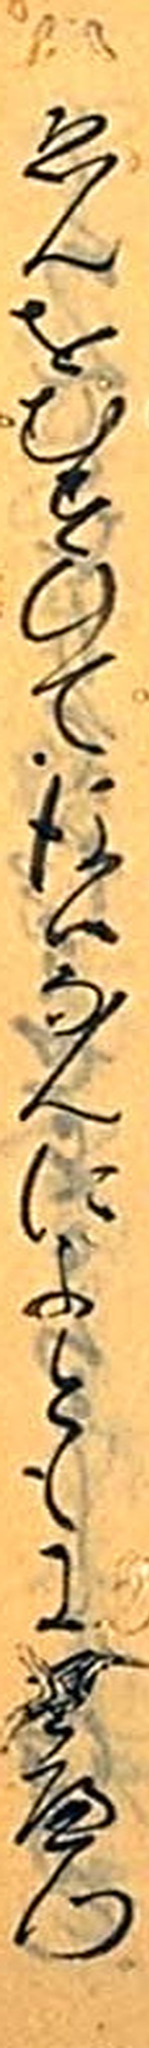ゑんをむすひて後はなんによともにへつ
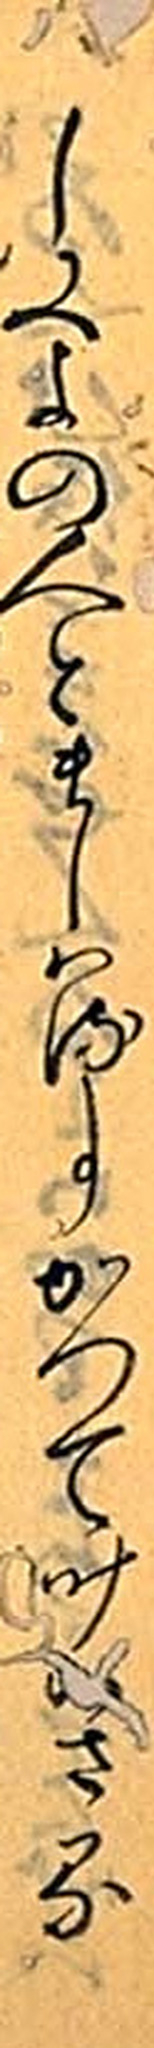し又よの人とましはる事かつて叶はさる
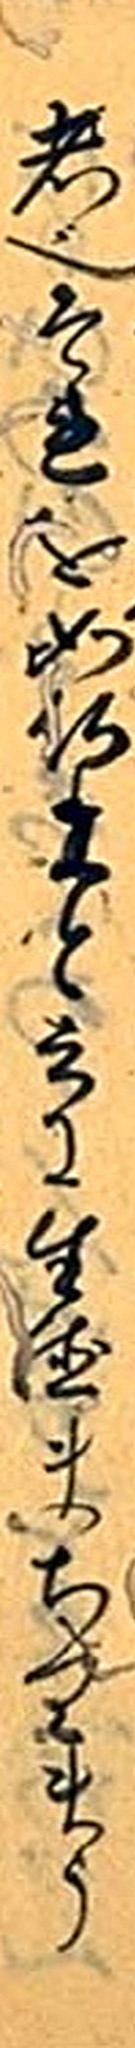者也それを如何にと云に生徳まちりまう
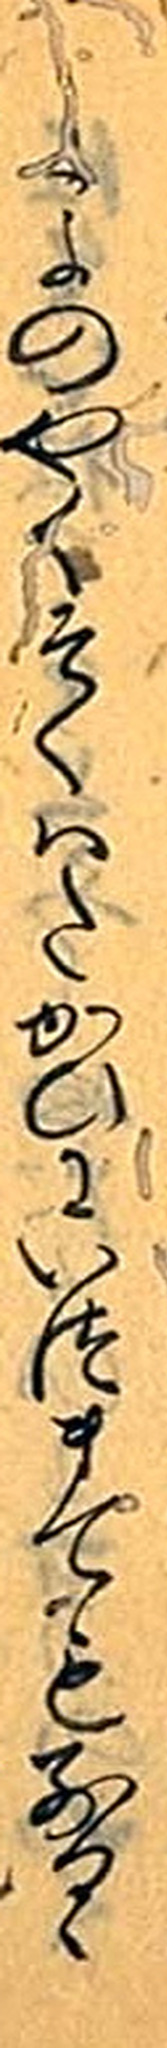よのやくそくはたかひにいつまても別るゝ
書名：ドチリナ・キリシタン
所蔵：東京大学総合図書館 / General Library in the University of Tokyo
